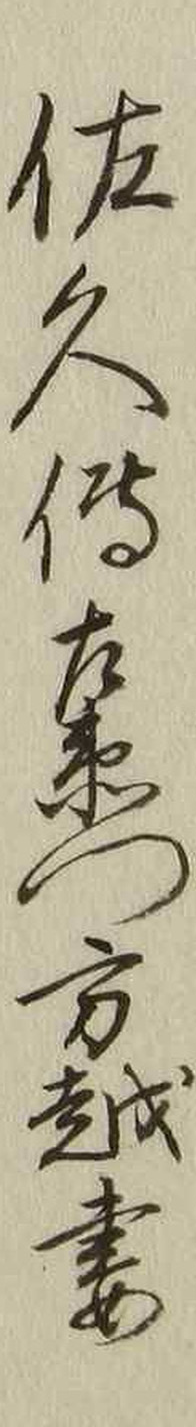佐久伝左衛門方越妻
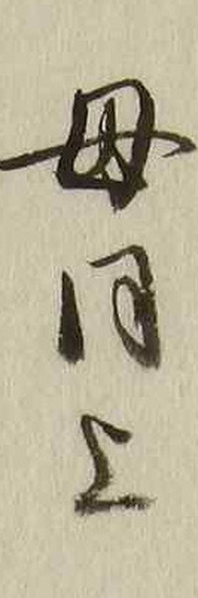母同上
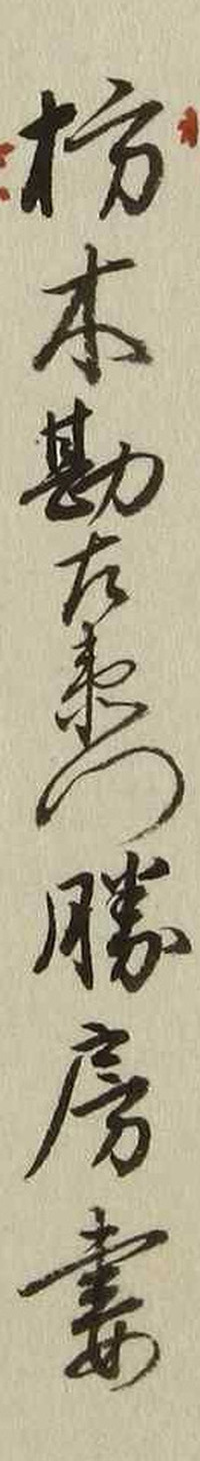女栃木勘左衛門勝房妻
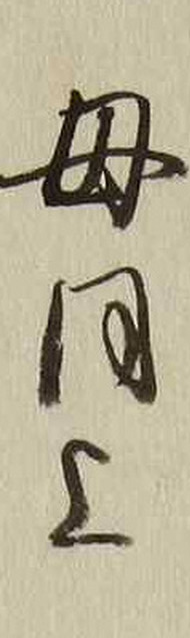母同上
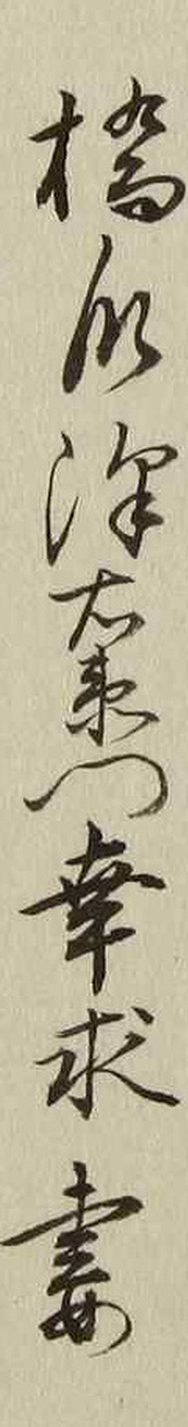女橋爪沢右衛門幸求妻
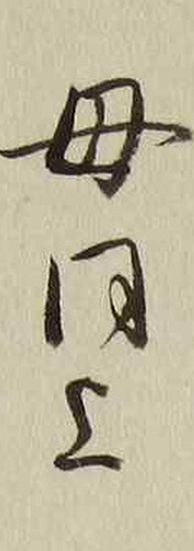母同上
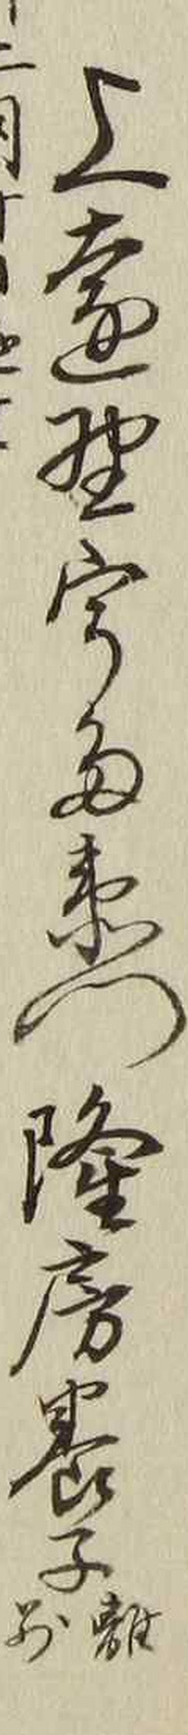上遠野宇多衛門隆房養子離別
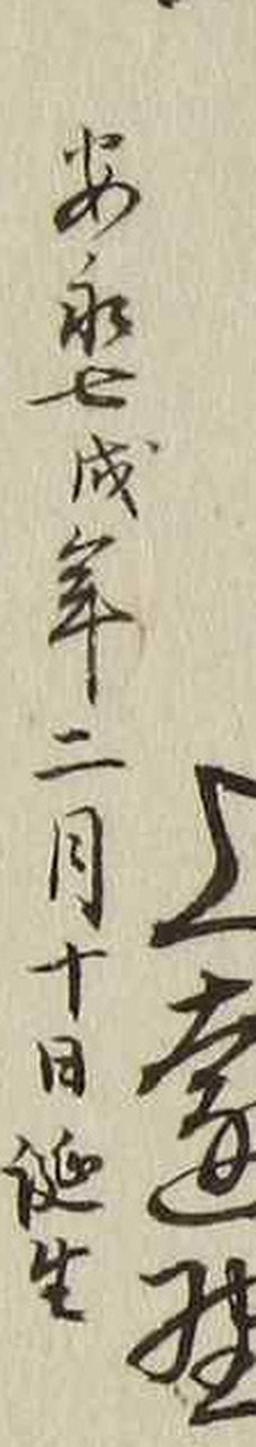安永七戌年二月十日誕生
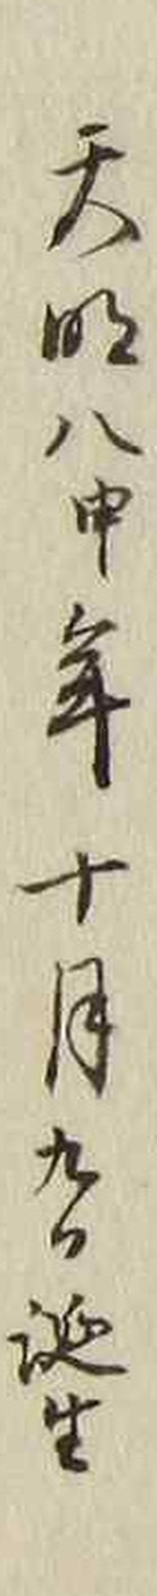天明八申年十月九日誕生

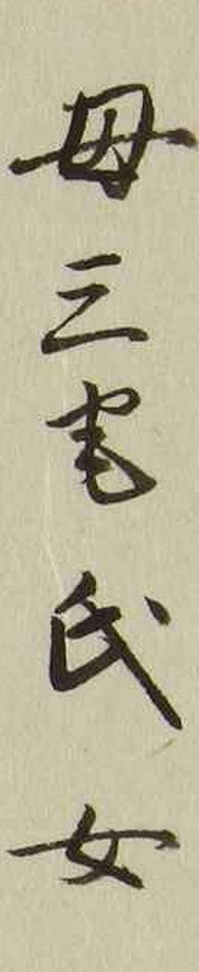母三宅氏女
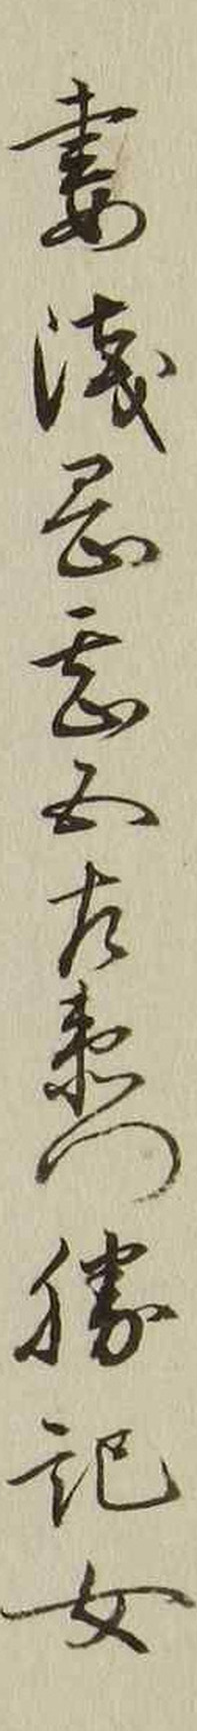妻浅岡甚五左衛門勝記女
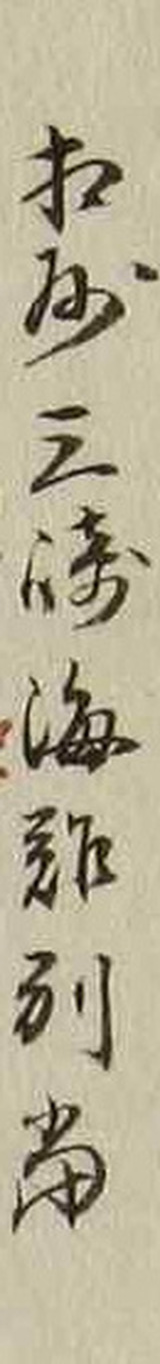相州三崎海難別当
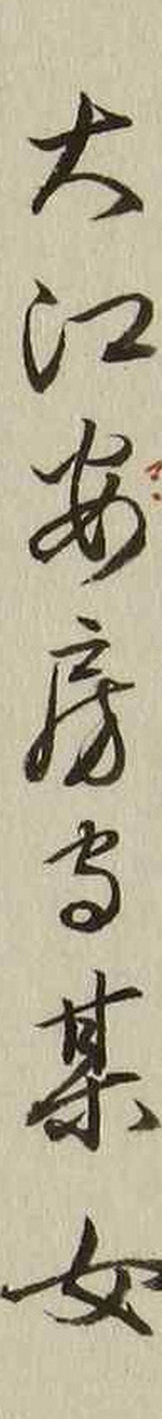大江安房守某女
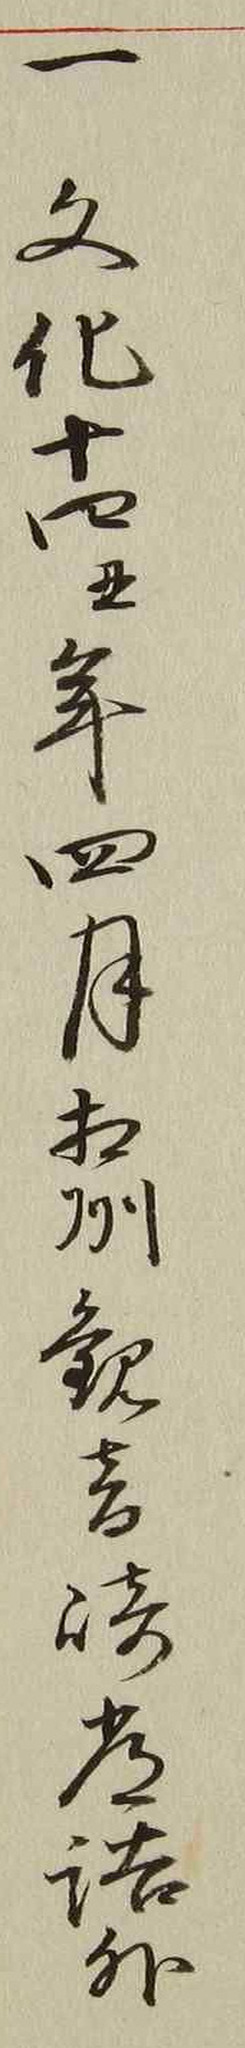一文化十四丑年四月相州観音崎常詰外
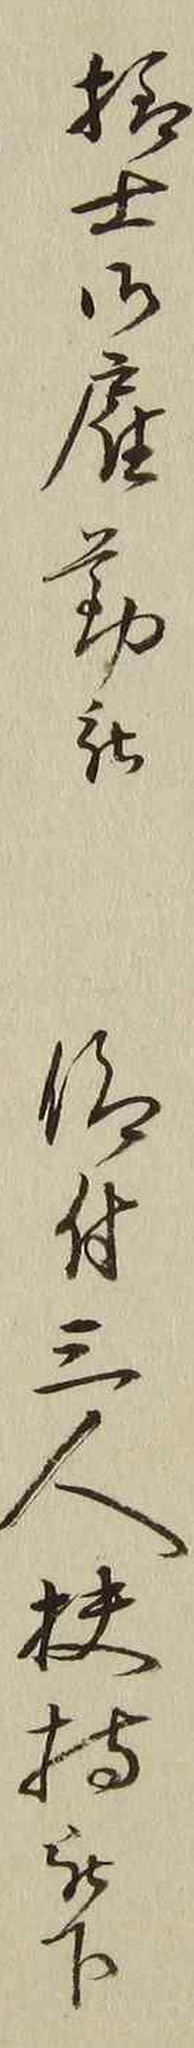様士御雇勤被仰付三人扶持被下
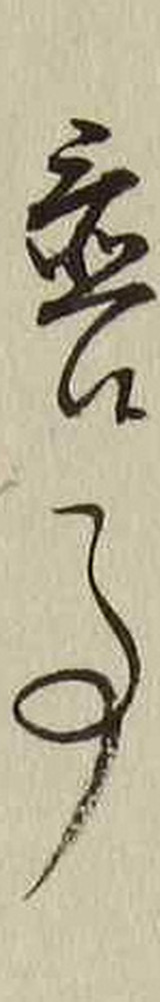置候事
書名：諸士系譜　巻之114　か之部22
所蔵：会津若松市立会津図書館
